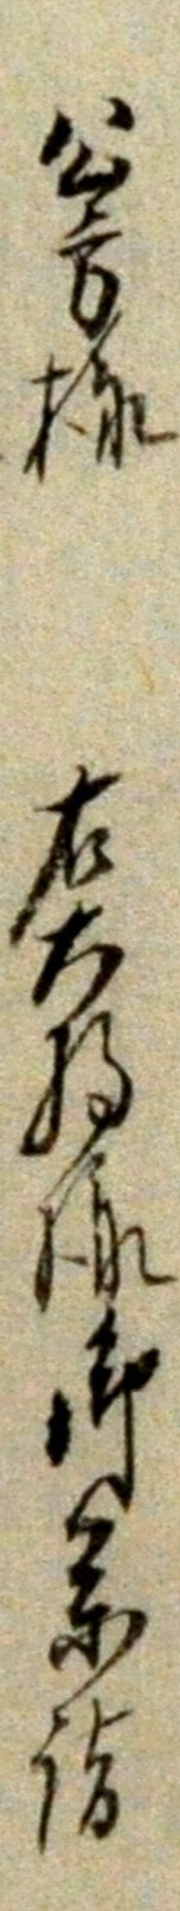公方様右大将様御参詣
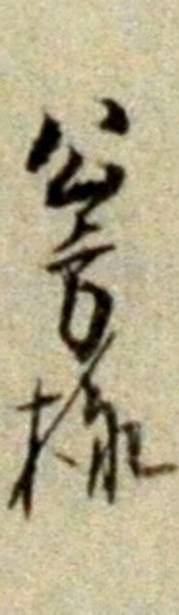公方様
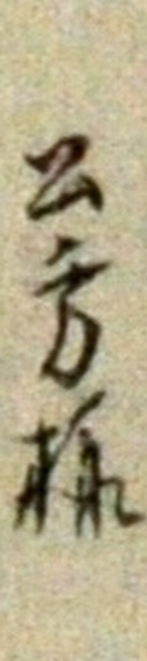公方様

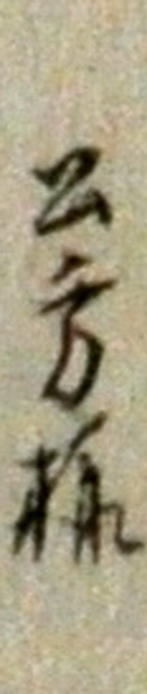公方様
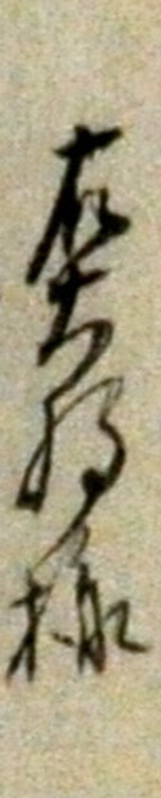右大将様
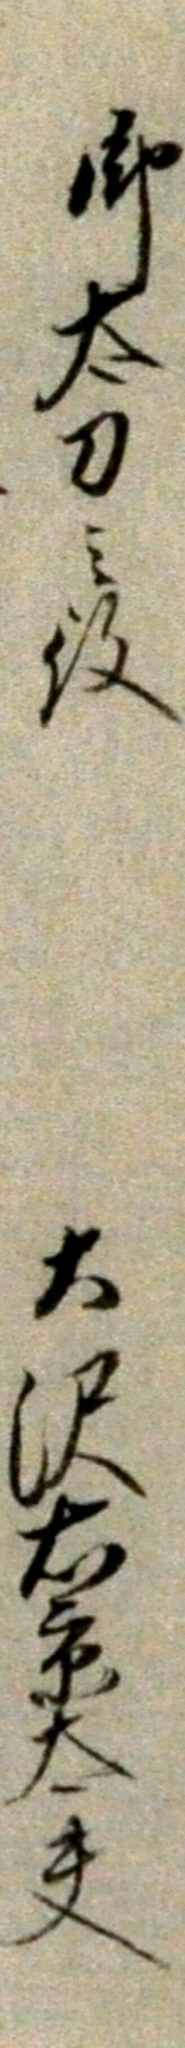御太刀之役大沢右京太夫
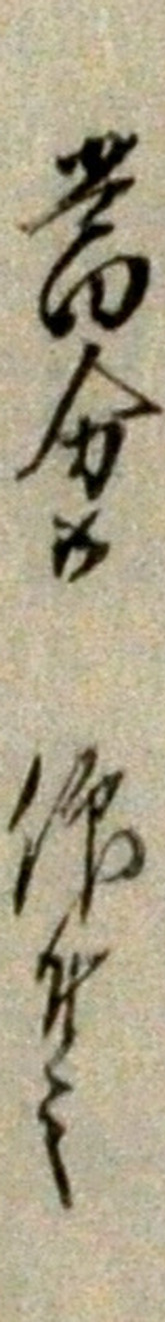当分被仰付之
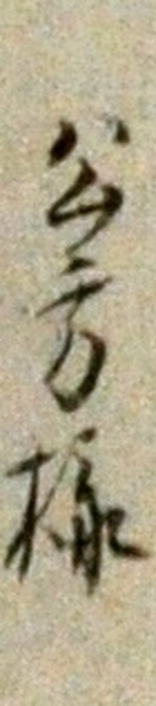公方様
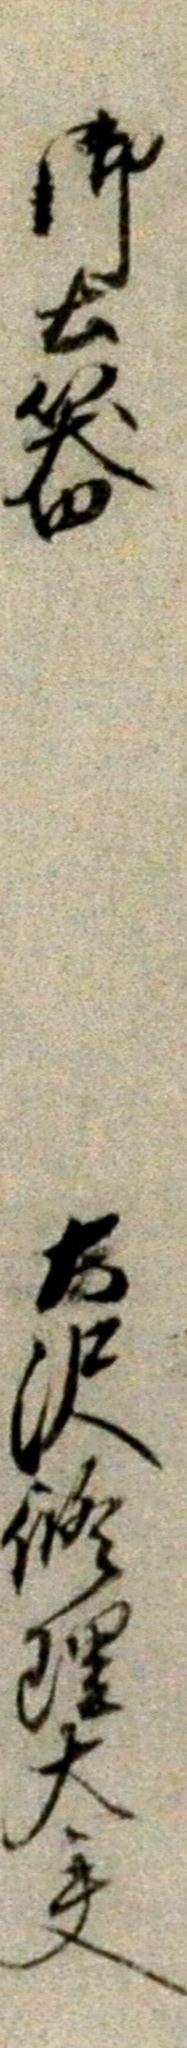御土器大沢修理太夫
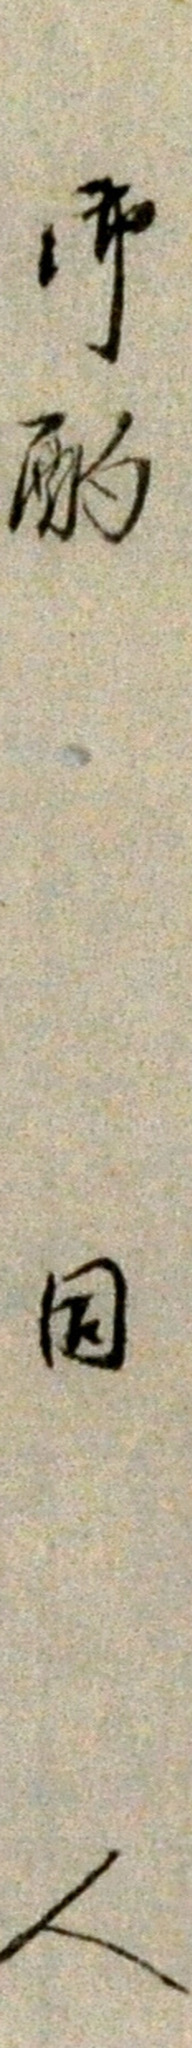御酌同人
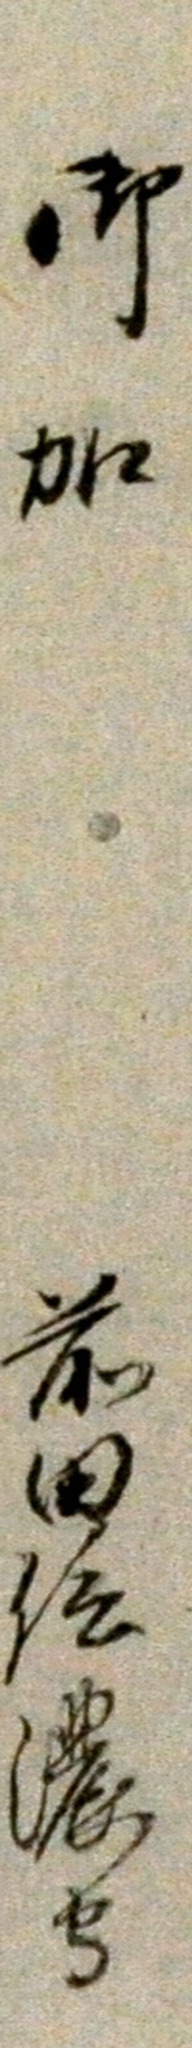御加前田信濃守
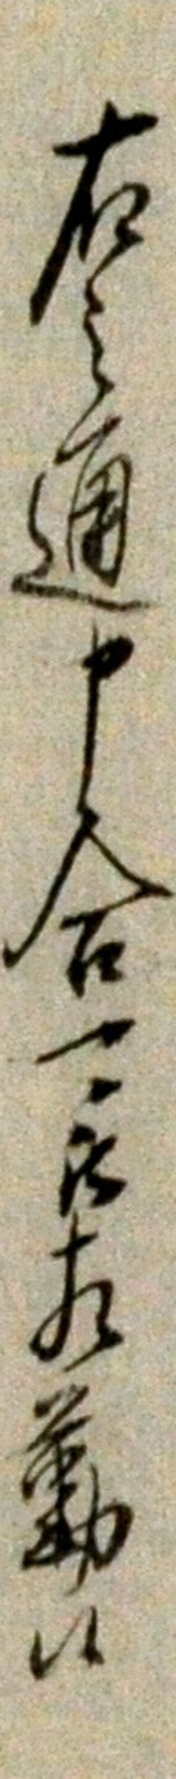右之通申合可被相勤候
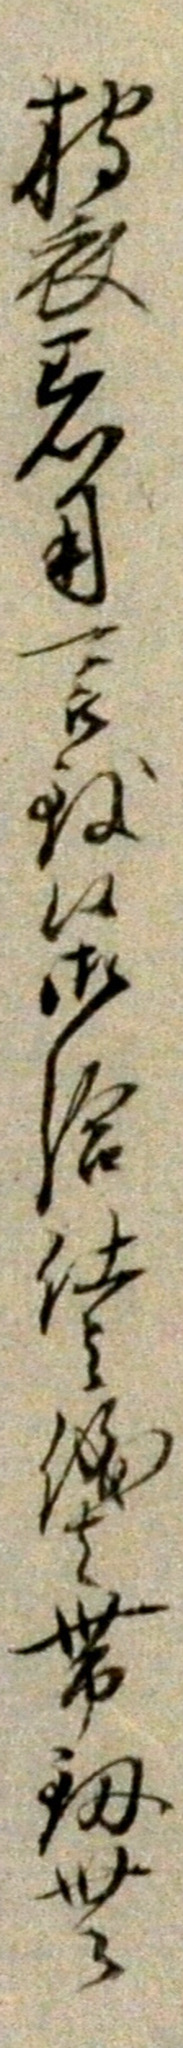狩衣着用可被致候御給仕之儀は帯剱無
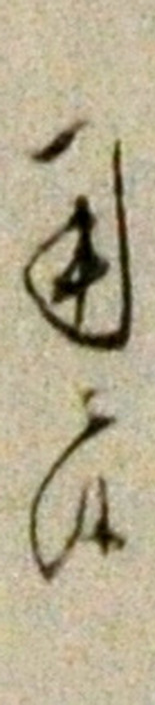用ニ候
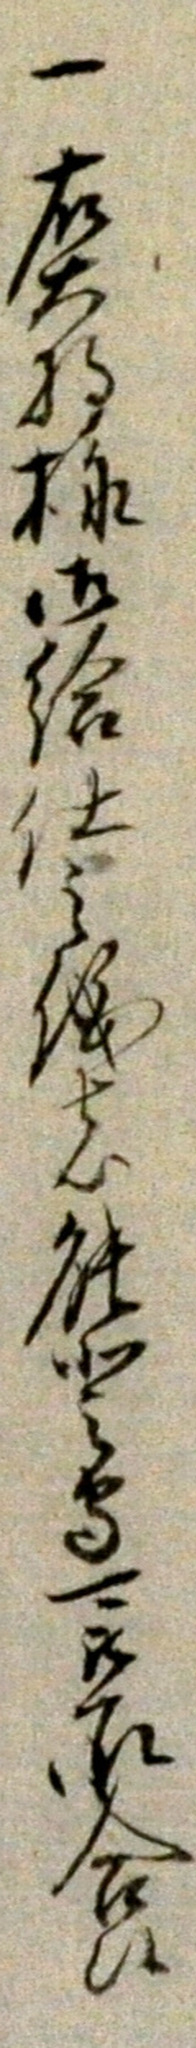一右大将様御給仕之儀は能登守可被承合候
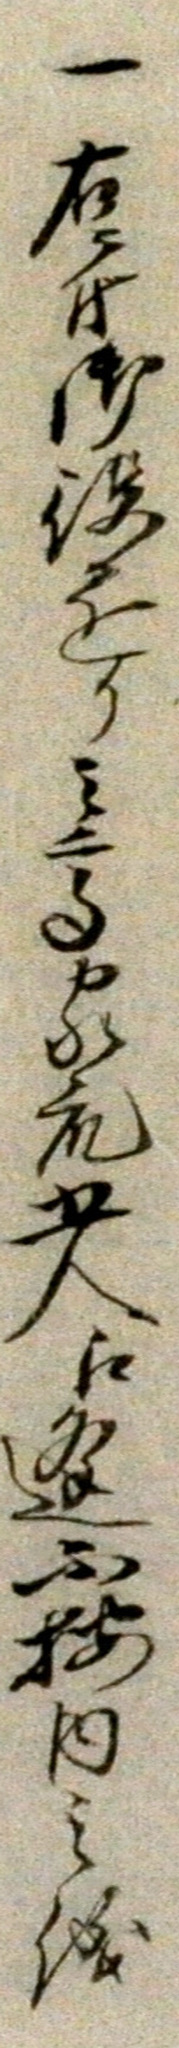一右ニ付御役懸り之高家衆五人え逢不按内之儀
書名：御鏡餅御用留（写）
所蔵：伊那市立高遠町図書館・合同会社AMANE
